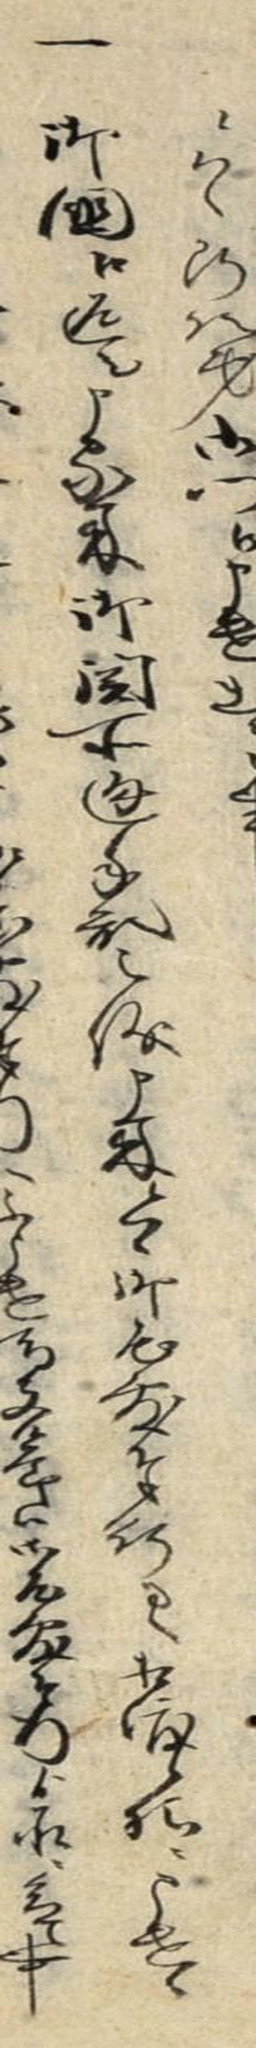一御国江返し申家来御関所通手形之儀申来候はゝ御屋敷奉行方へ相渡候様に申遣候
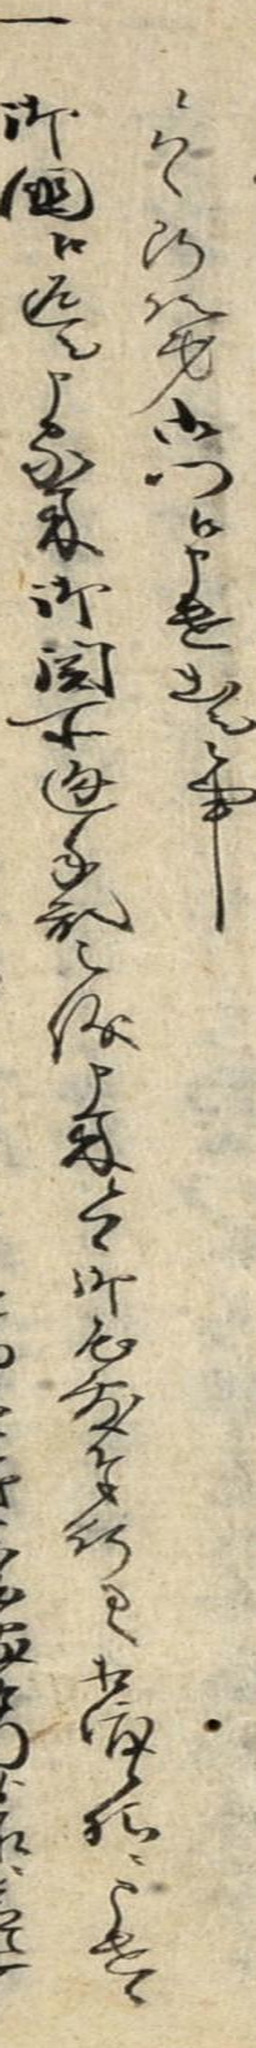一御国江返し申家来御関所通手形之儀申来候はゝ御屋敷奉行方へ相渡候様に申遣候
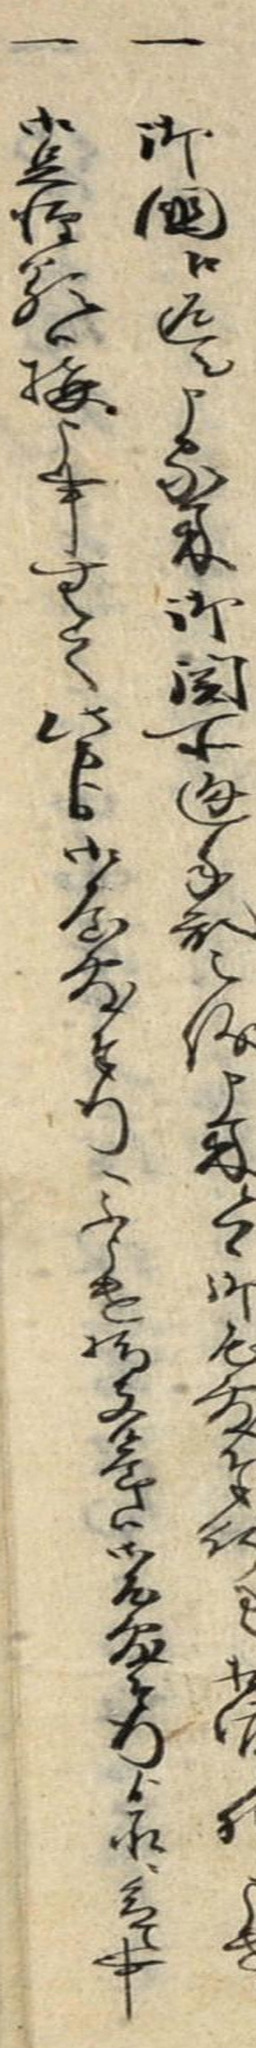一御足軽類は構申事無之此方ゟ御屋敷奉行へ不申遣指支候節は御屋敷奉行ゟ承参候事

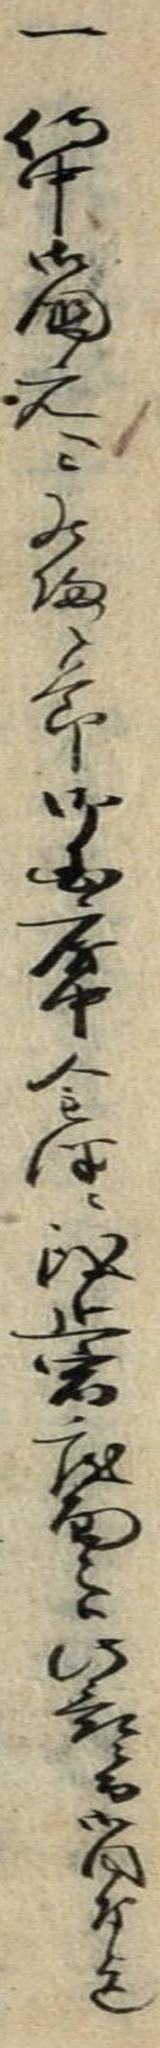一侍中御国元へ被罷越候節御国府中金沢に致止宿度面々には此表にて御目付迄
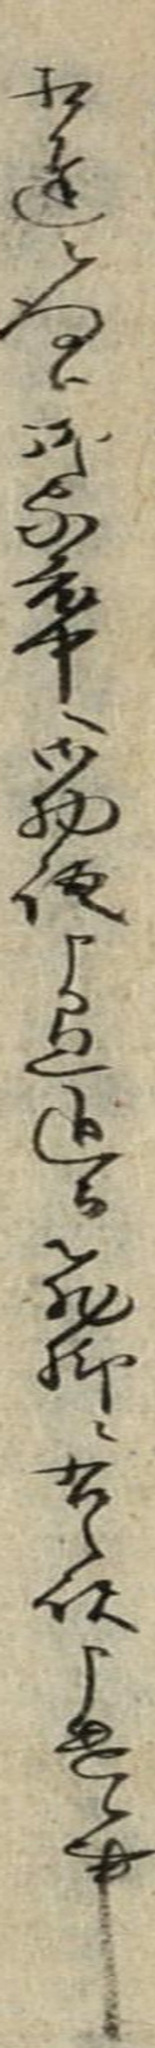相達候得は御家老中へ御物語申置追て飛脚に右之訳申遣候事
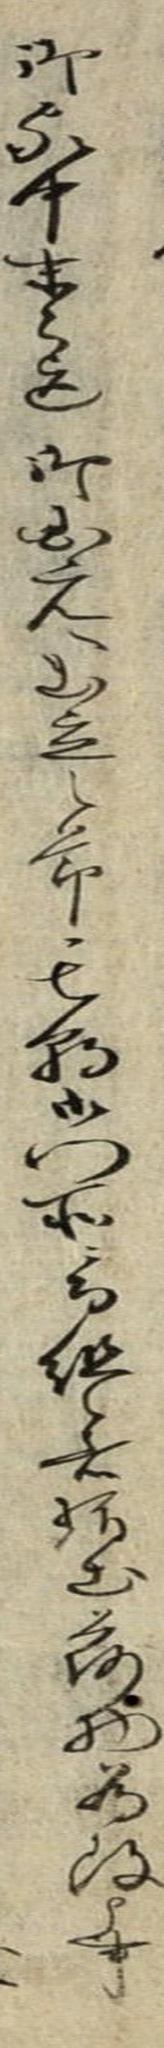一御家中末々迄御国元へ出立之節其朝御門所にて組之者指出荷物為改申事
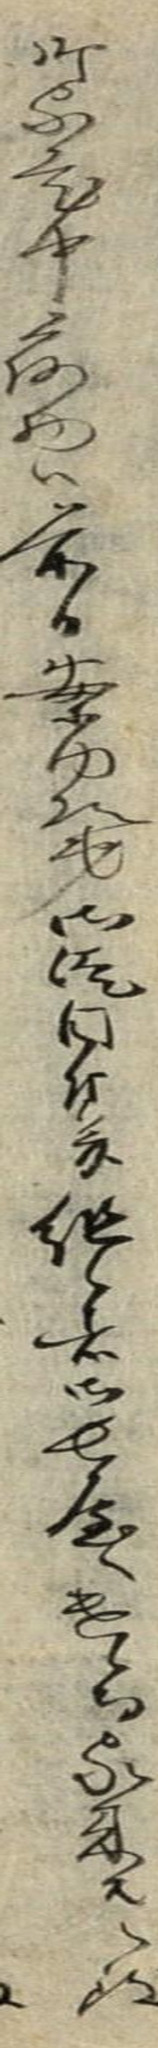御家老中荷物は前日案内次第御徒目付并組之者御長屋へ遣候て家来共へ致
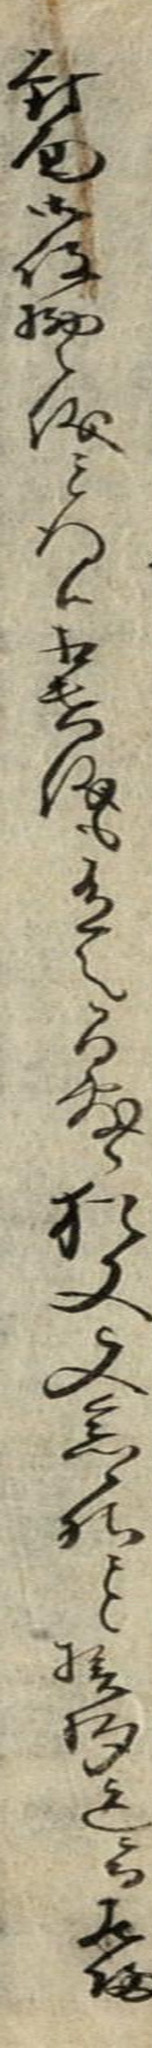対面御役柄之儀に候得は相替儀も有之間敷候猶又被入念候様にと挨拶迄にて罷帰
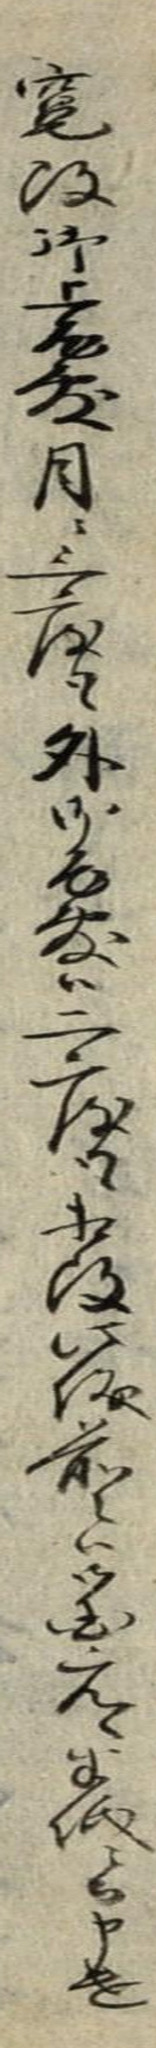一寛政御上屋敷月に三度ツヽ外御屋敷は二度ツヽ相改此儀前々は御国元へ半紙にて申遣
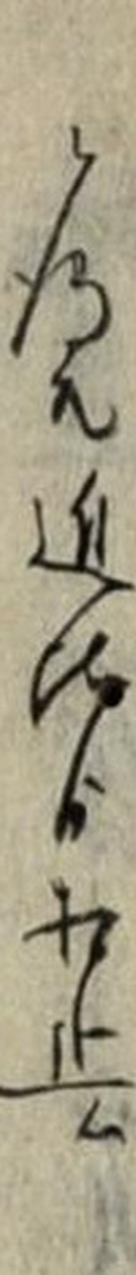候得共近頃ゟ相止む
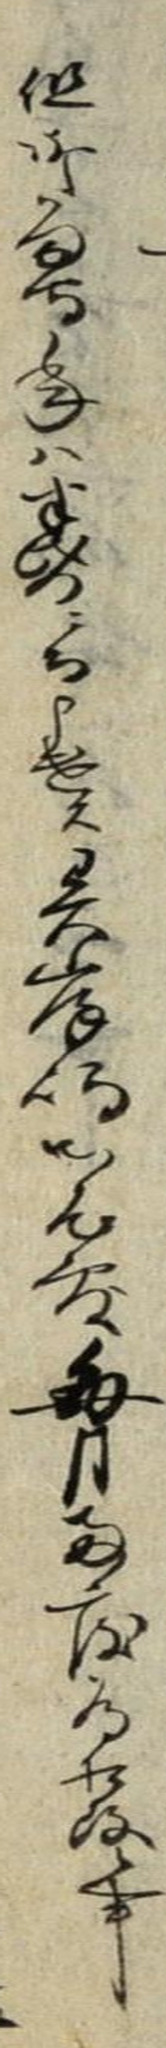但御留守年は半紙にて申遣す霊岸嶋御屋敷毎月両度為相改候事
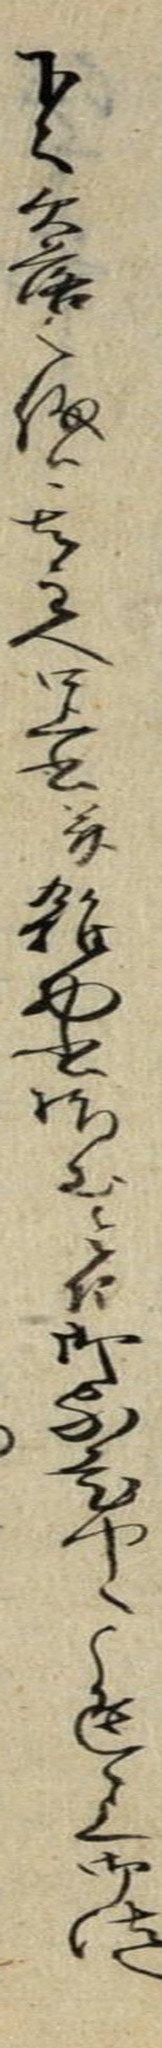一下々欠落之儀は其主人口上書并雑物書指出候に付御家老中へ申達候上御法之
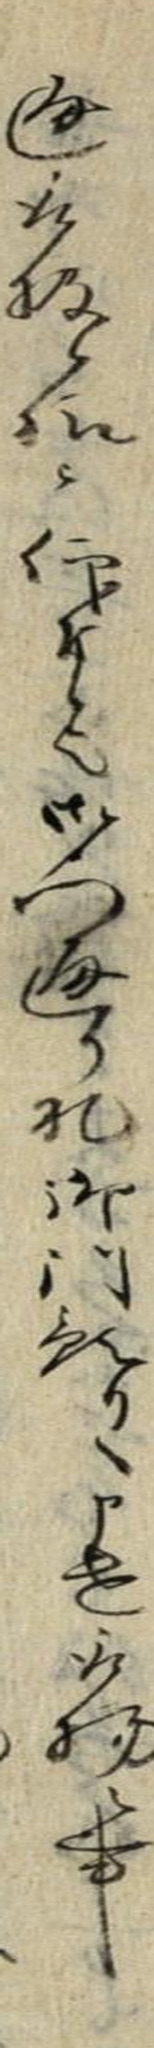通取扱候様被仰付候也御門通り札御門預りへ申遣取揚候事
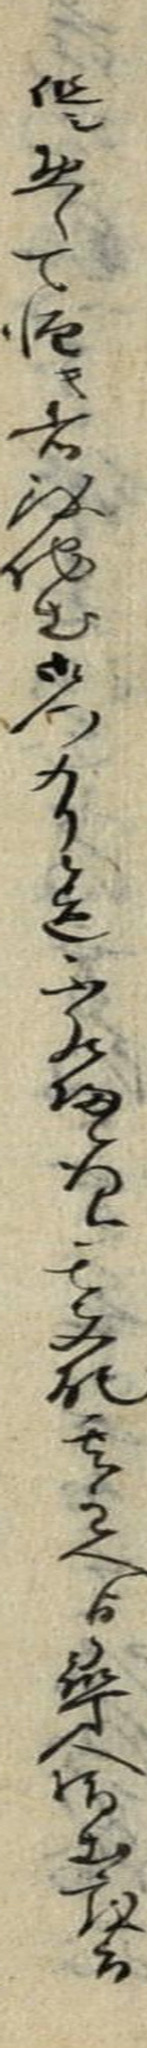但し惣して軽き者致他出御門〆り候迄不罷帰候得は其支配其主人ゟ尋人指出度旨
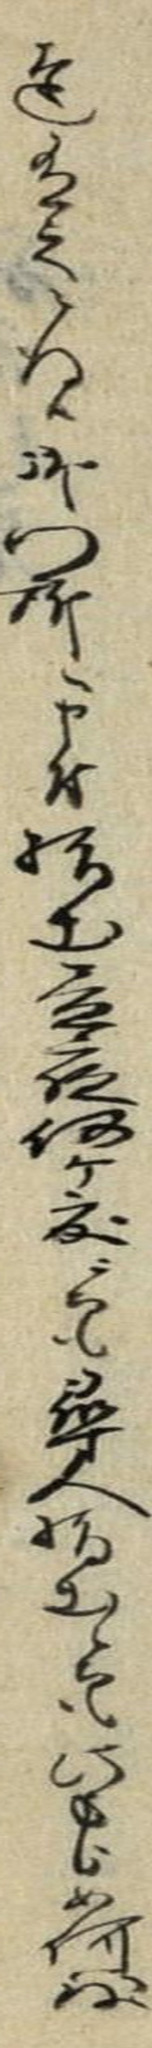達有之候得は御門所へ申付指出昼夜何ケ度にても尋人指出候ても此方ゟ如何致
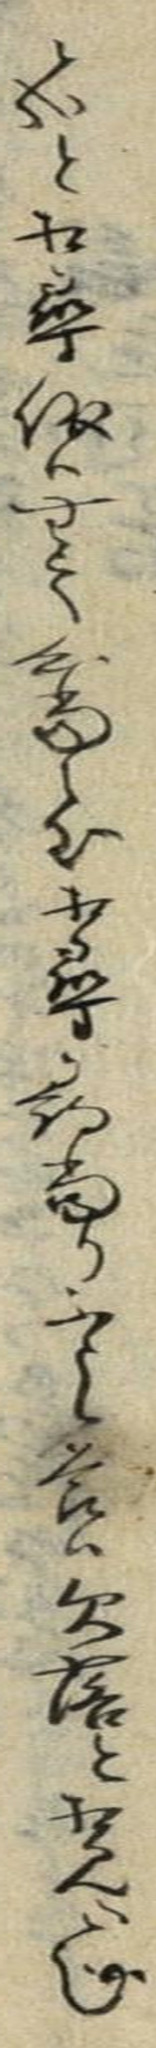候哉と相尋儀は無之心当之義相尋尋当り不申候節は欠落と相見へ候趣
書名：三都并道中之部
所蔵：福井県文書館 Fukui Prefectural Archives
